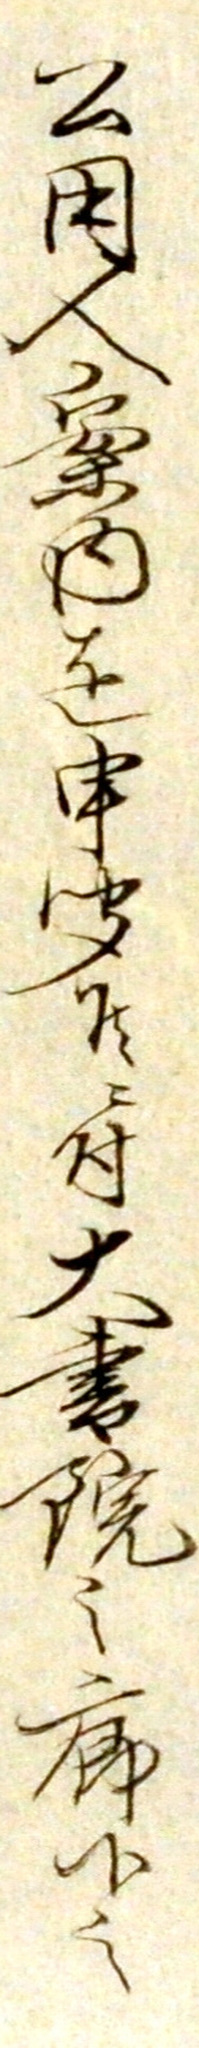公用人案内を申聞候ニ付大書院之廊下之
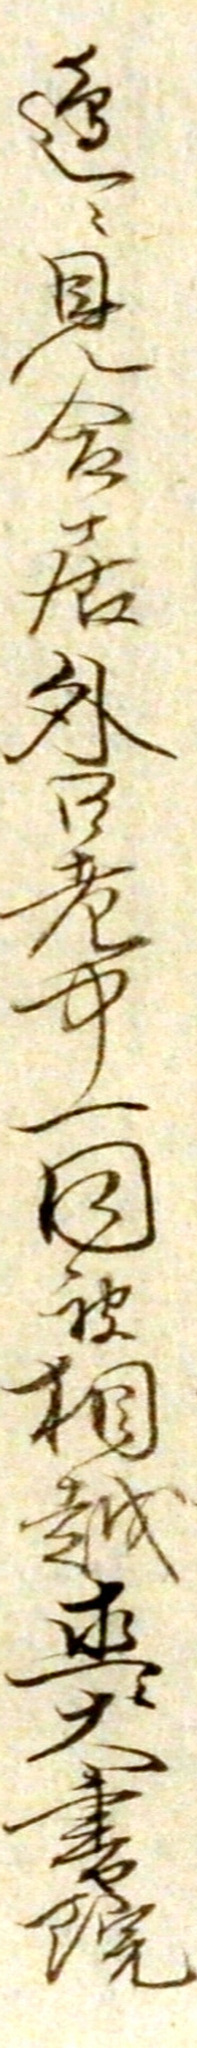辺ニ見合居外御老中一同被相越直ニ大書院

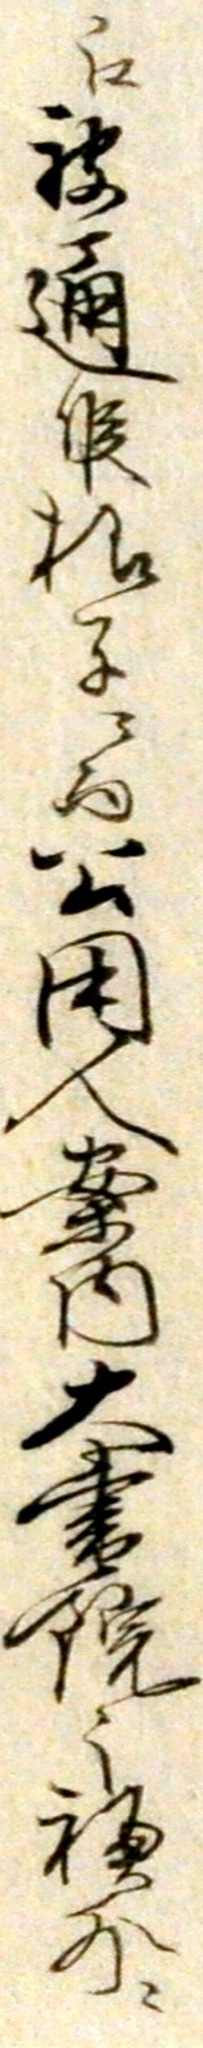え被通候様子ニ而公用人案内大書院之襖外ニ
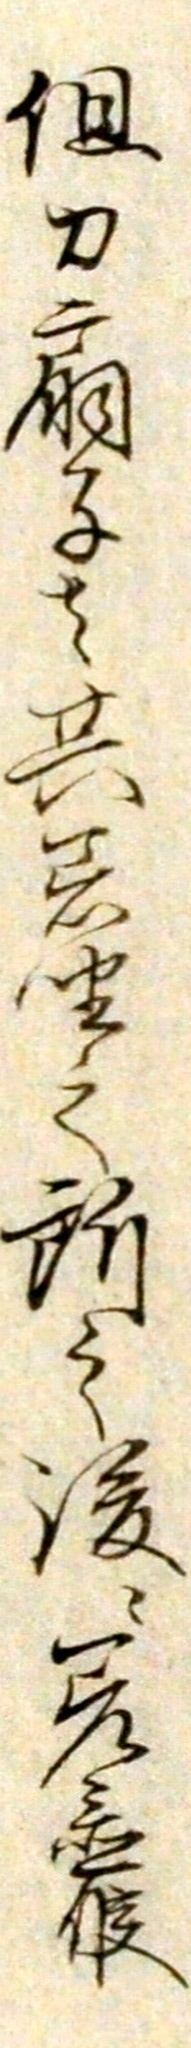但刀扇子は共着坐之所之後ニ差置候
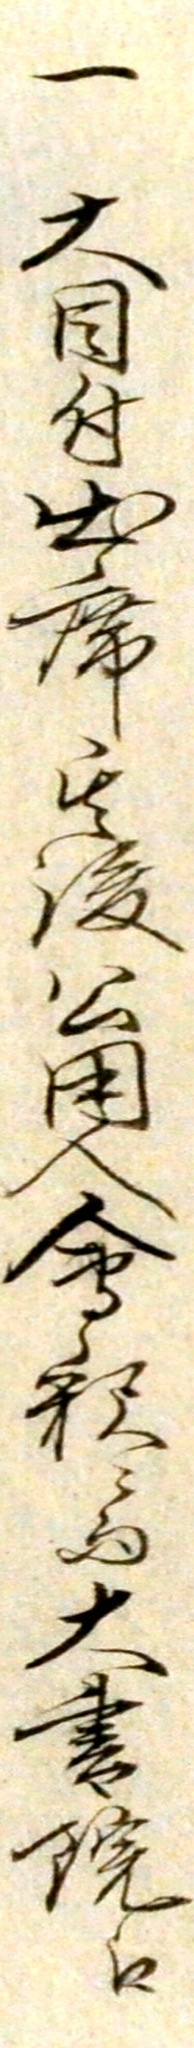一大目付出席其後公用人会釈ニ而大書院え
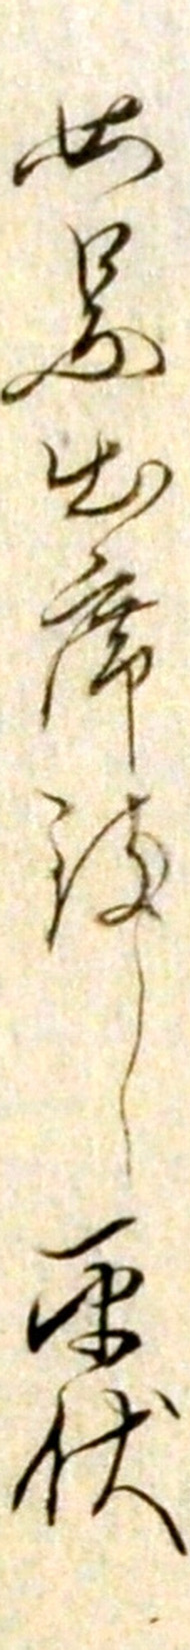如図出席致し平伏

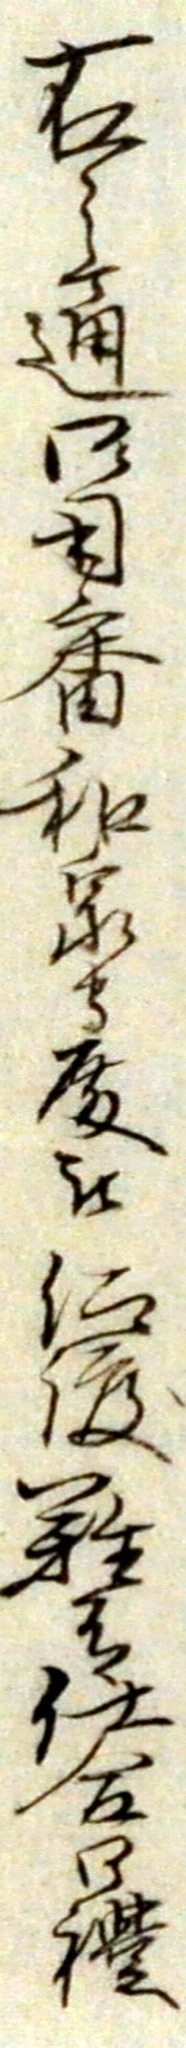右之通御用番和泉守殿被仰渡難有仕合御礼
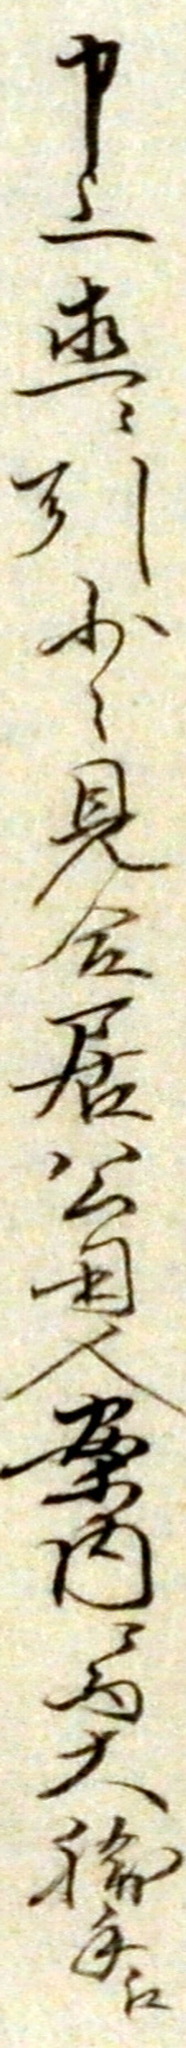申上直ニ引少々見合居公用人案内ニ而大勝手え
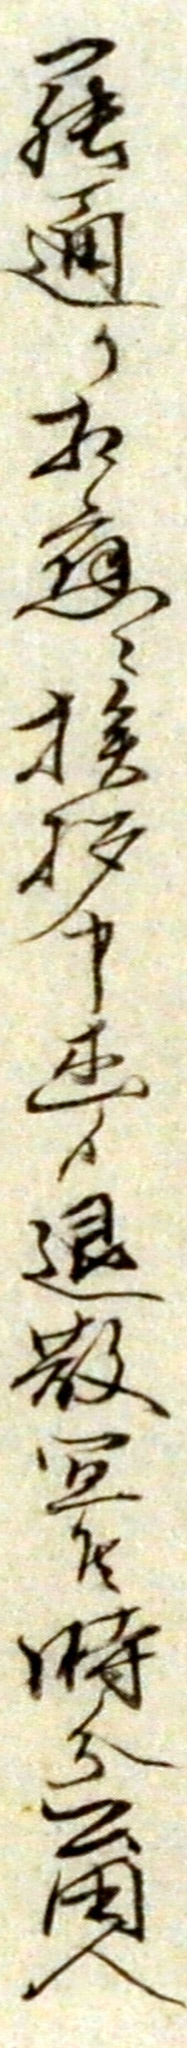罷通り相応ニ挨拶申述候退散宜候時分公用人
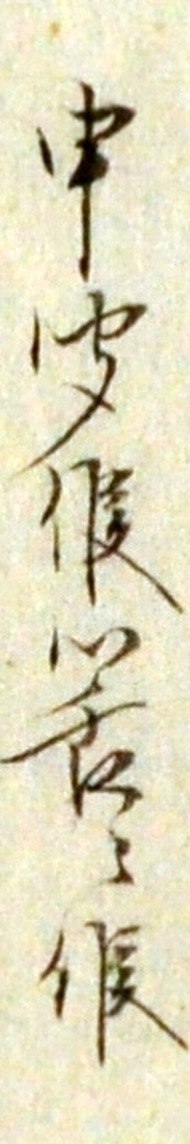申聞候筈ニ候
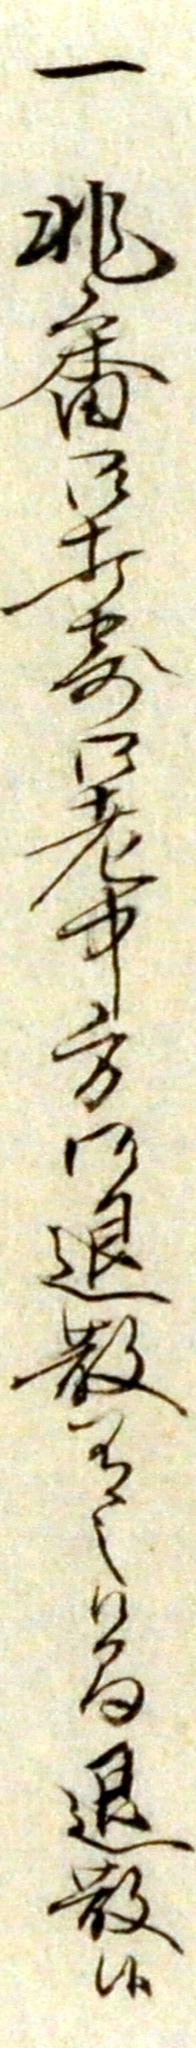一非番御打寄御老中方御退散有之候間退散候
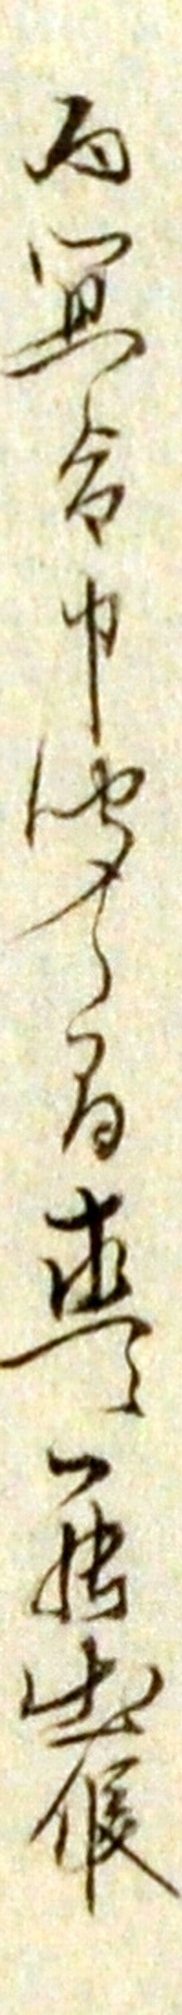而宜旨申聞候間直ニ罷出候
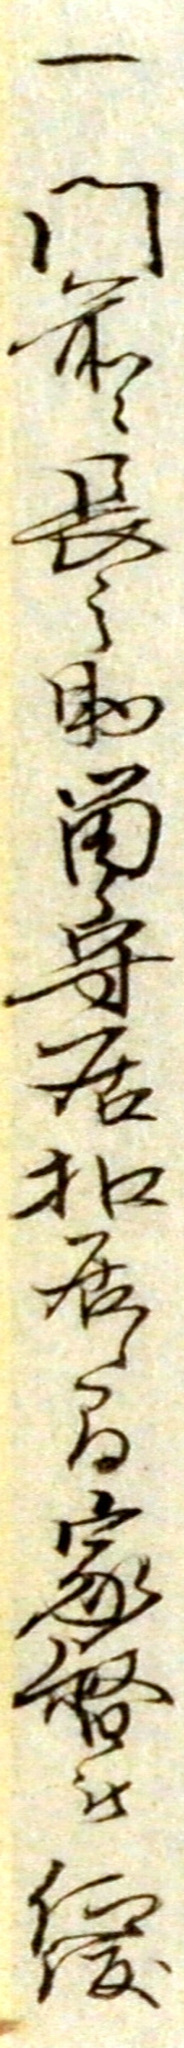一門前ニ長之助留守居扣居候間家督被仰渡
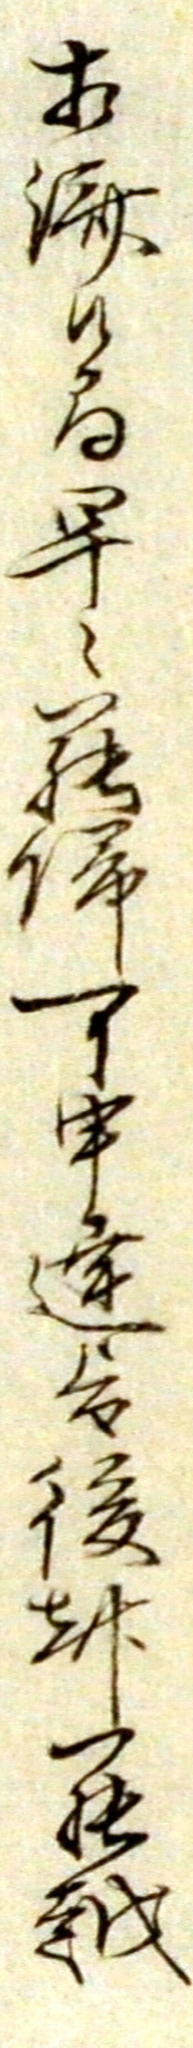相済候間早々罷帰可申達旨後刻罷越
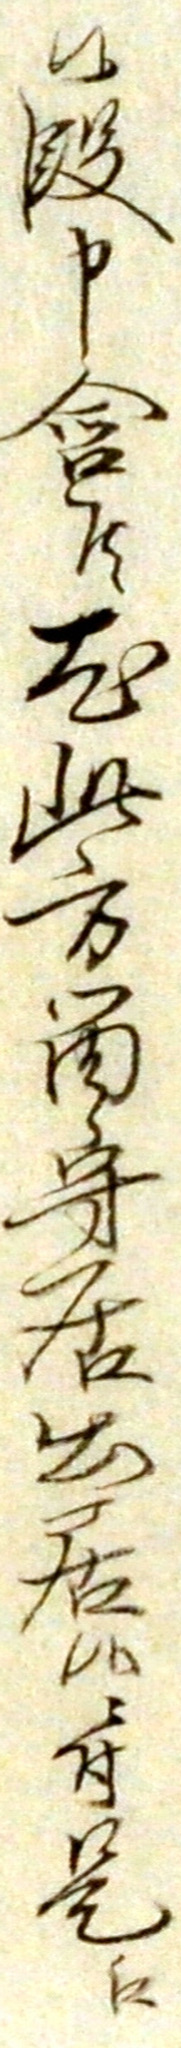候段申含候尤此方留守居出居候ニ付是え
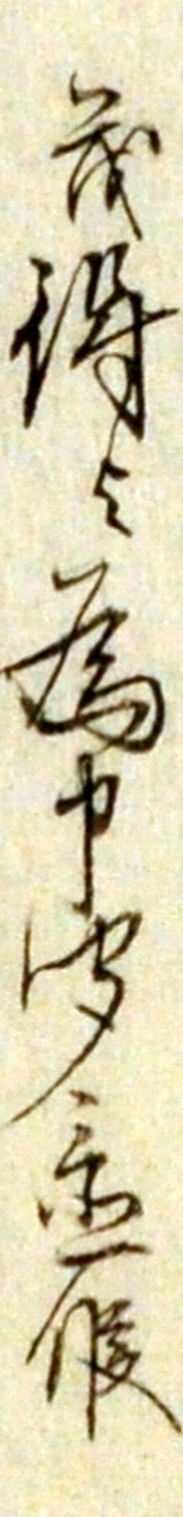も得と為申聞置候
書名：諸名代相勤候節ノ留書外
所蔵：伊那市立高遠町図書館・合同会社AMANE
